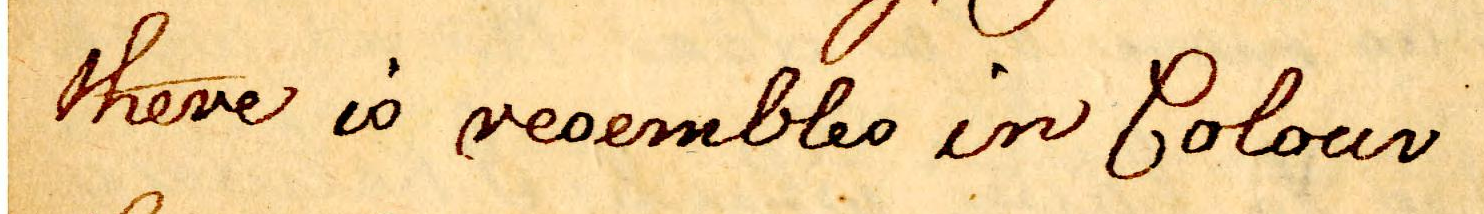there is resembles in Colour
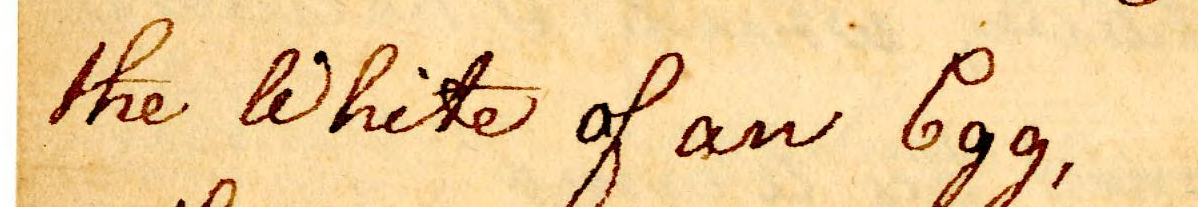the White of an Egg,
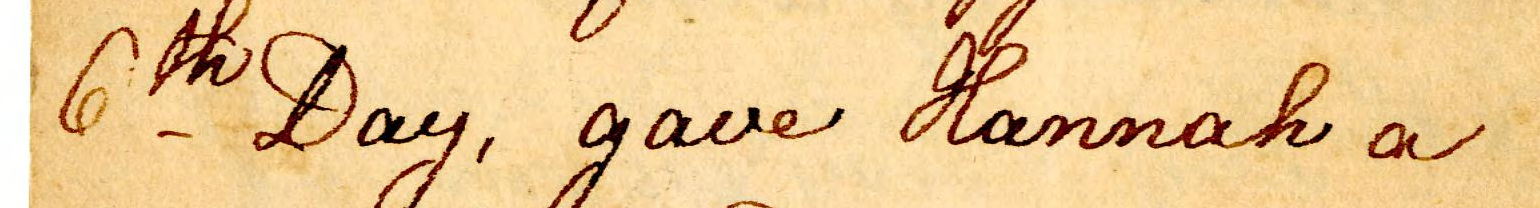6^th Day, gave Hannah a
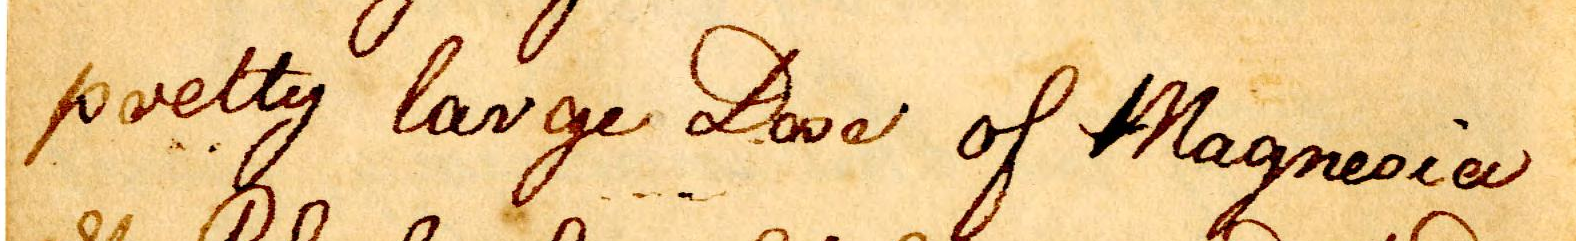pretty large Dose of Magnesia
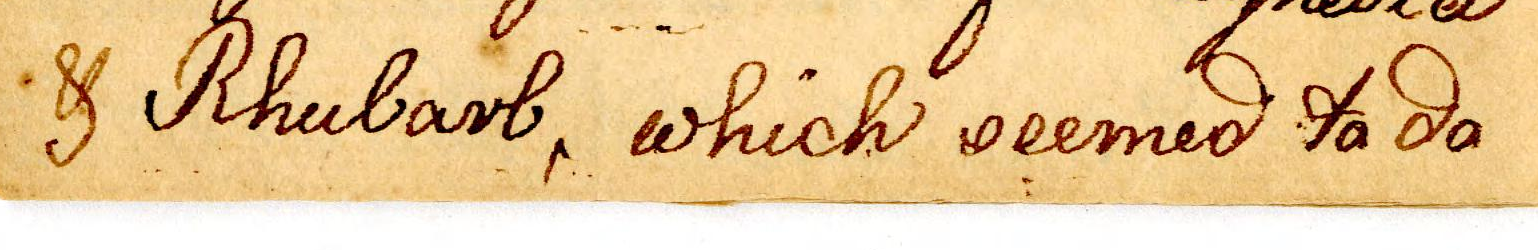& Rhubarb, which seemed to do
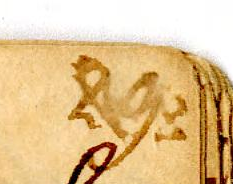29
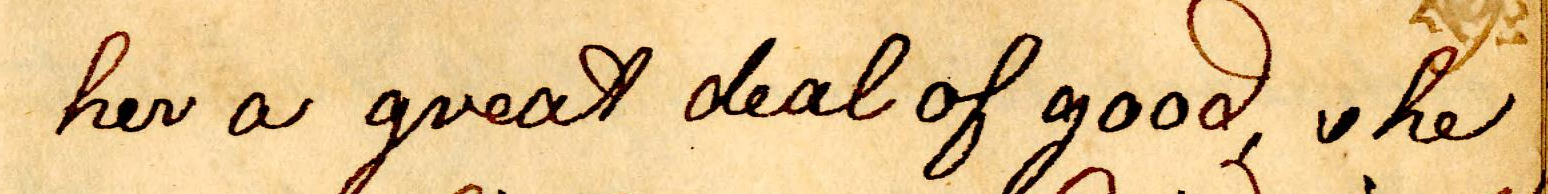her a great deal of good, she
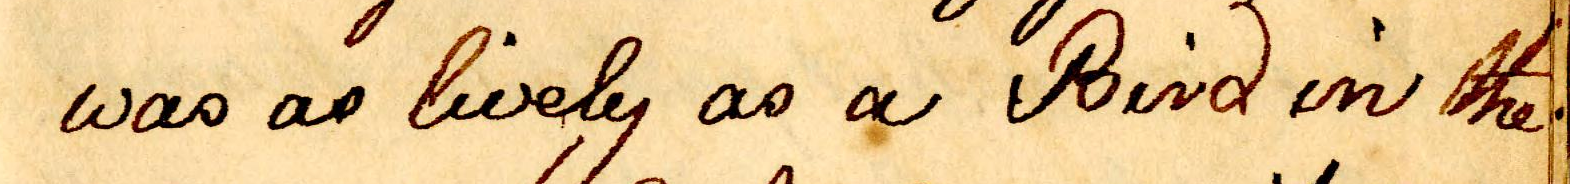was a lively as a Bird in the
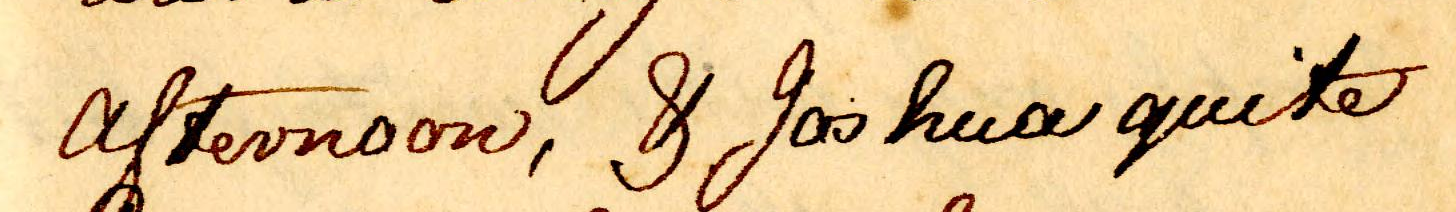Afternoon, & Joshua quite
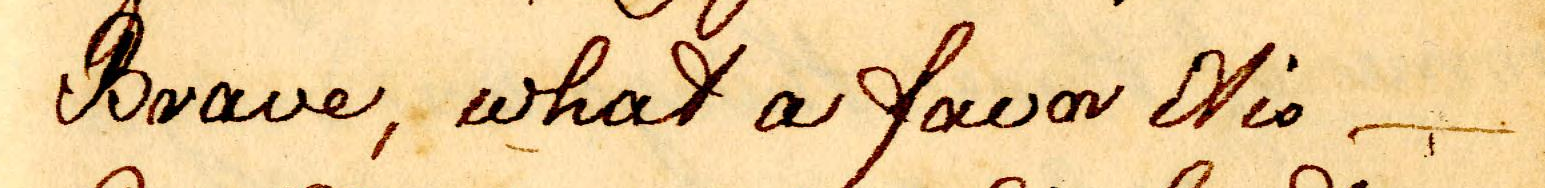Brave, what a favor it is
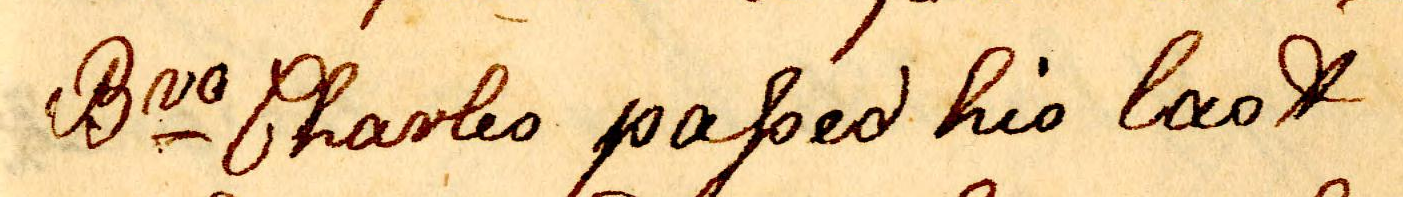Bro Charles passed his last
